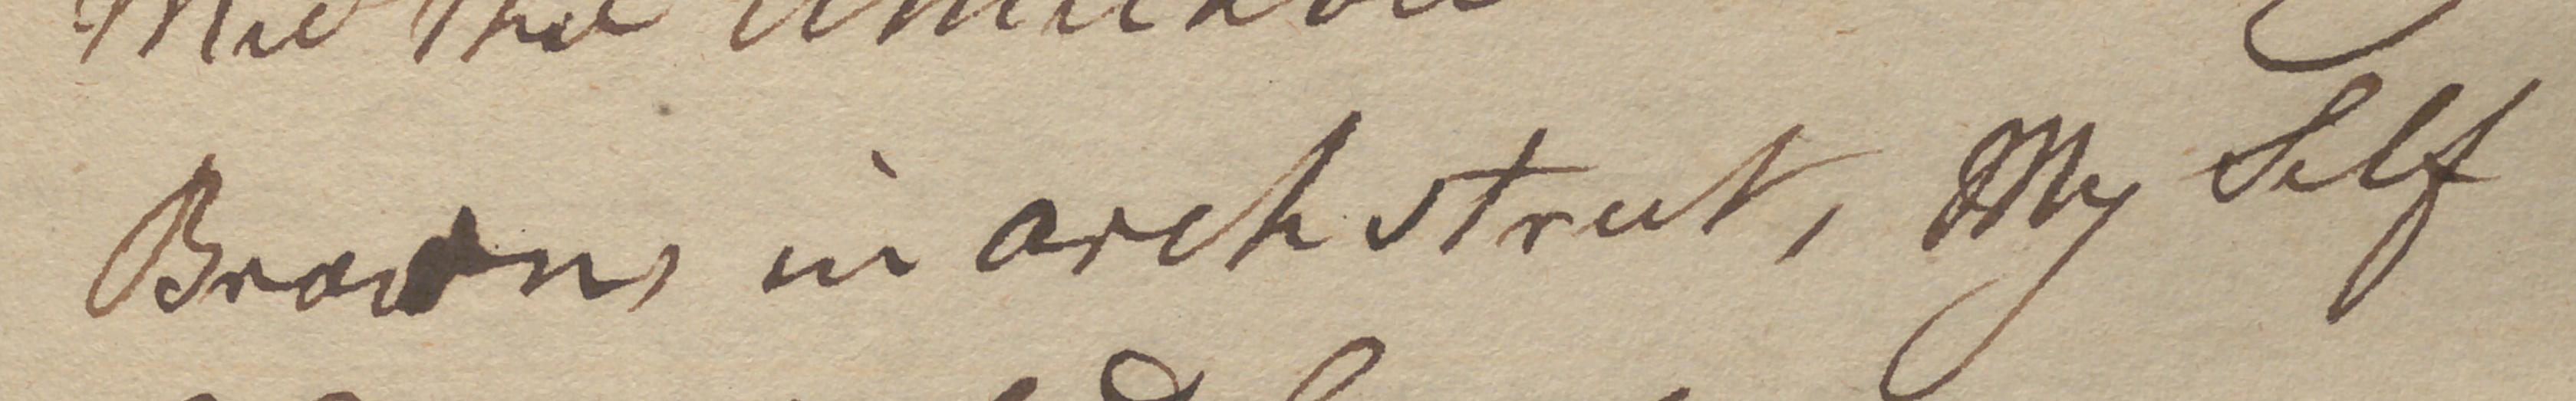Browns in arch street, My Self
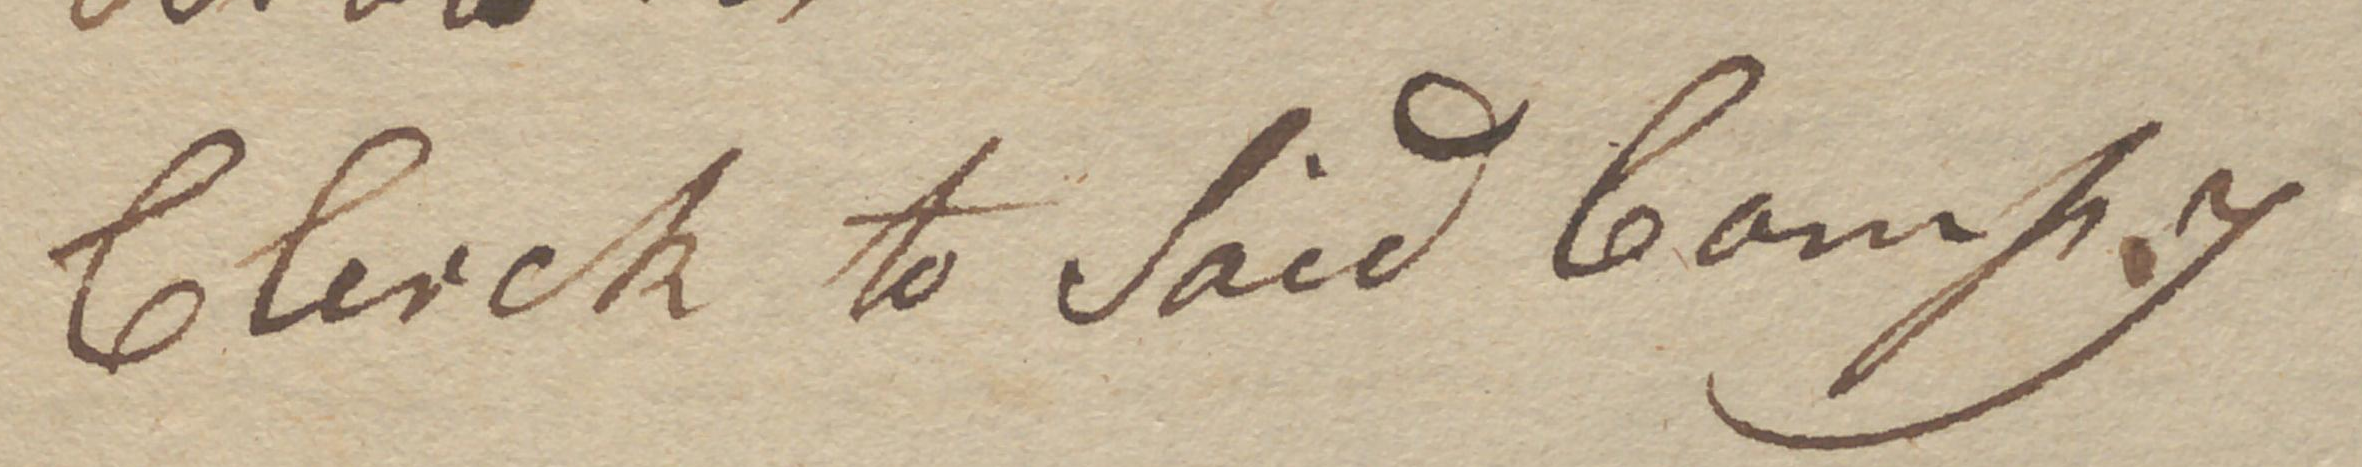Clerck to Said Compy
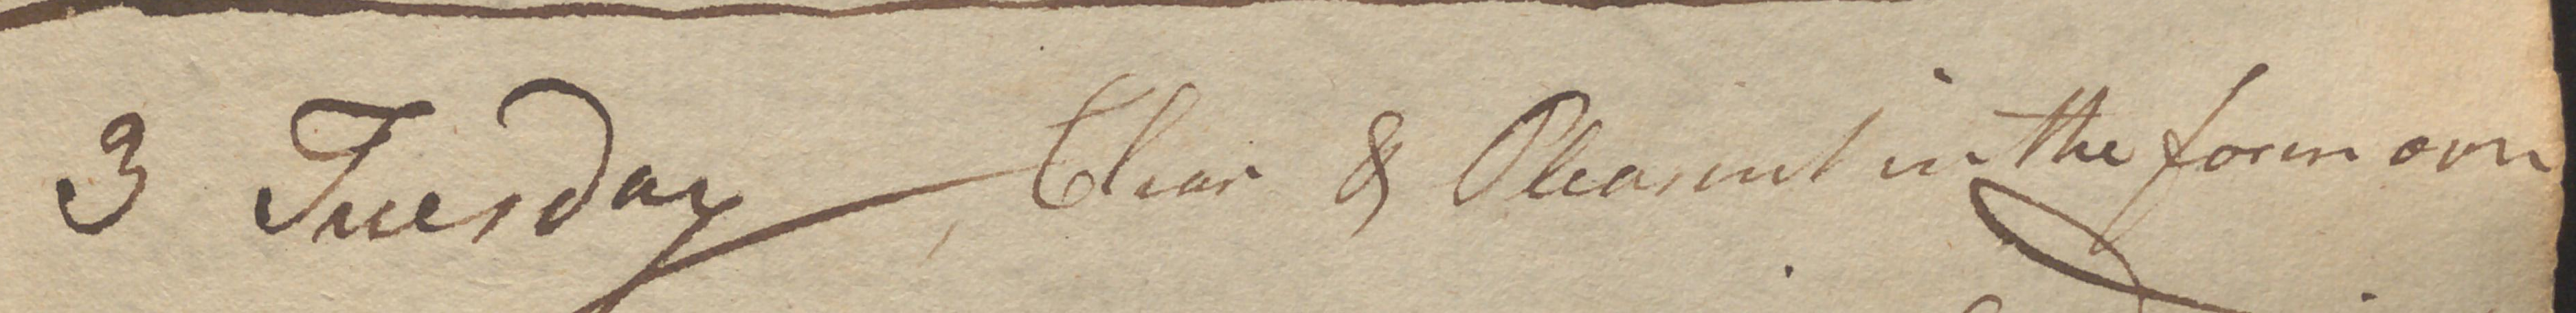3 Tuesday Clear & Pleasent in the forenoon
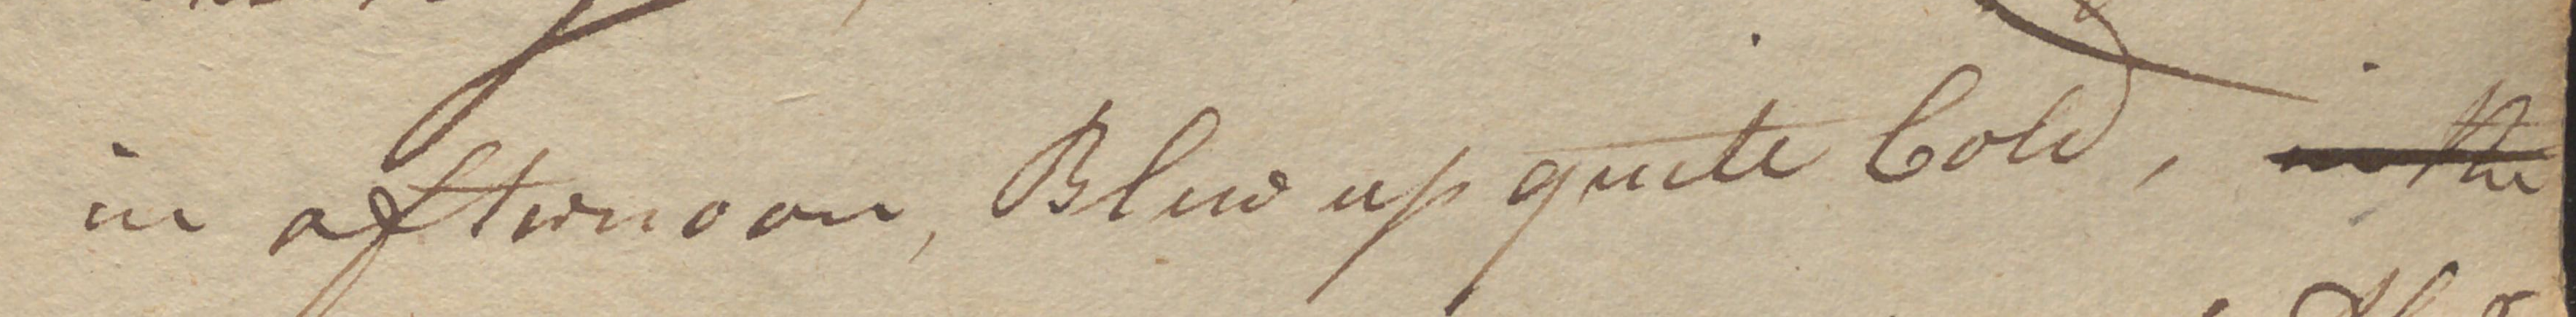in afternoon, Blew up quite Cold, [in the]
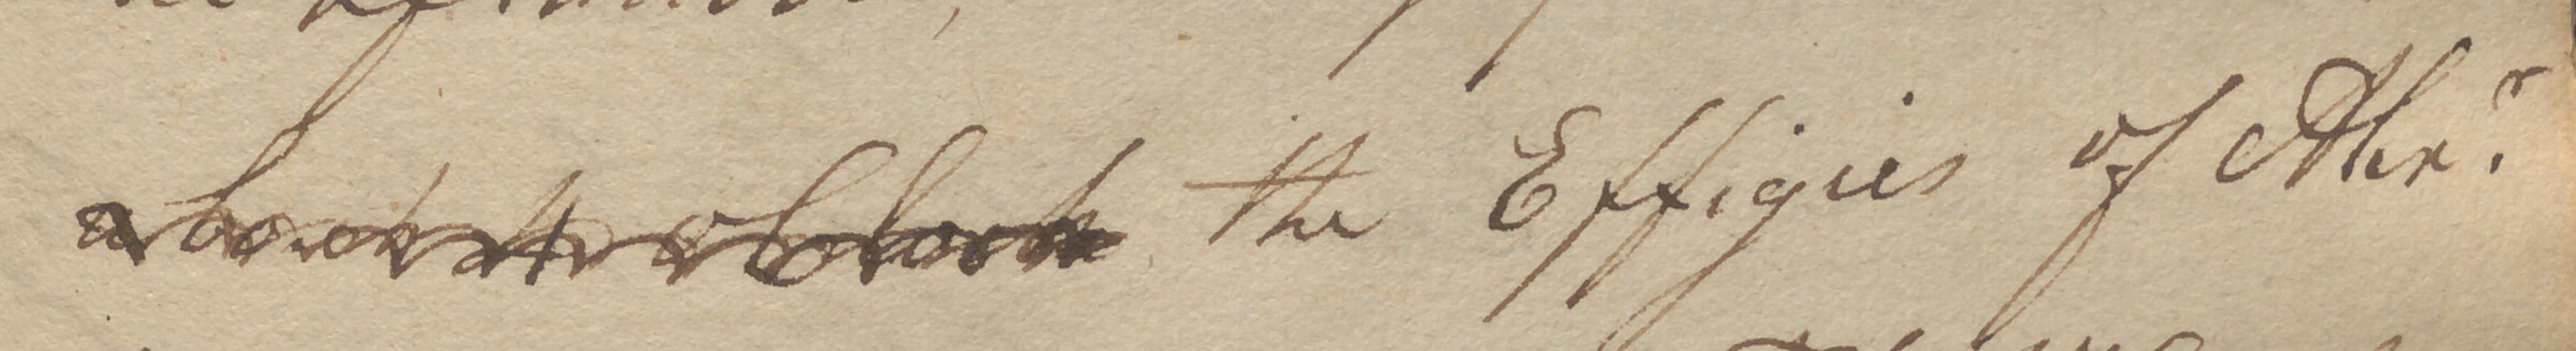[about 4 oClock] the Effigies of Alex^r.
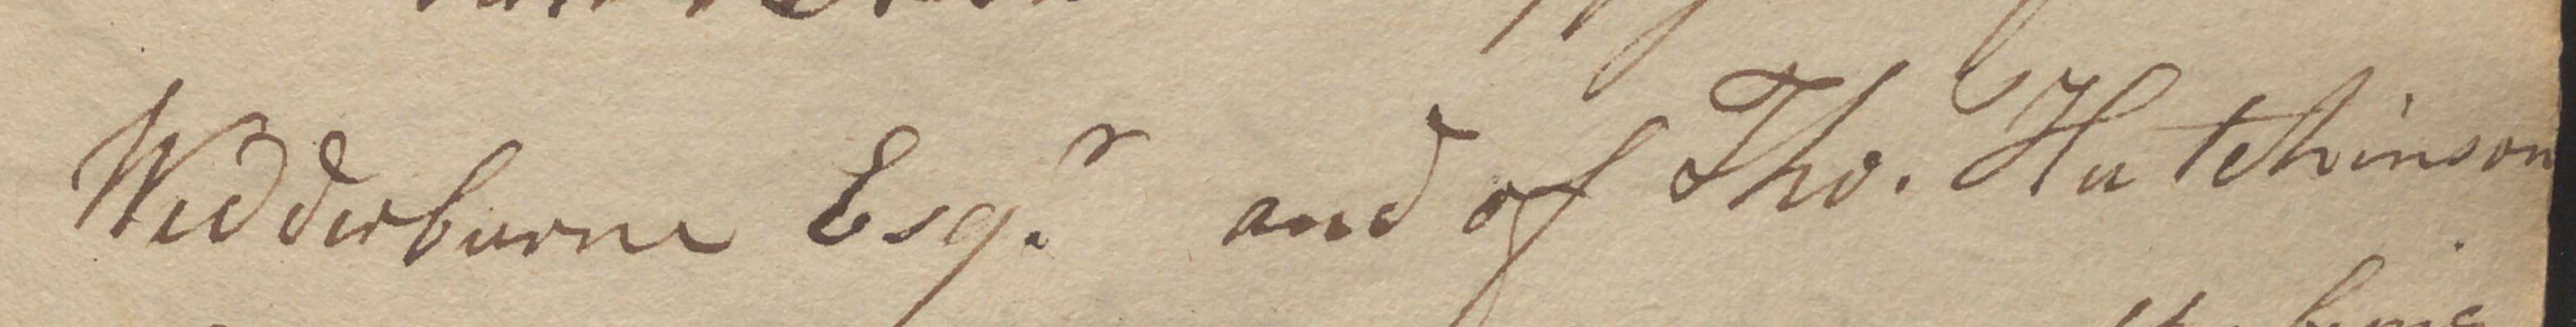Wedderburne Esq^r. and of Tho^s. Hutchinson
